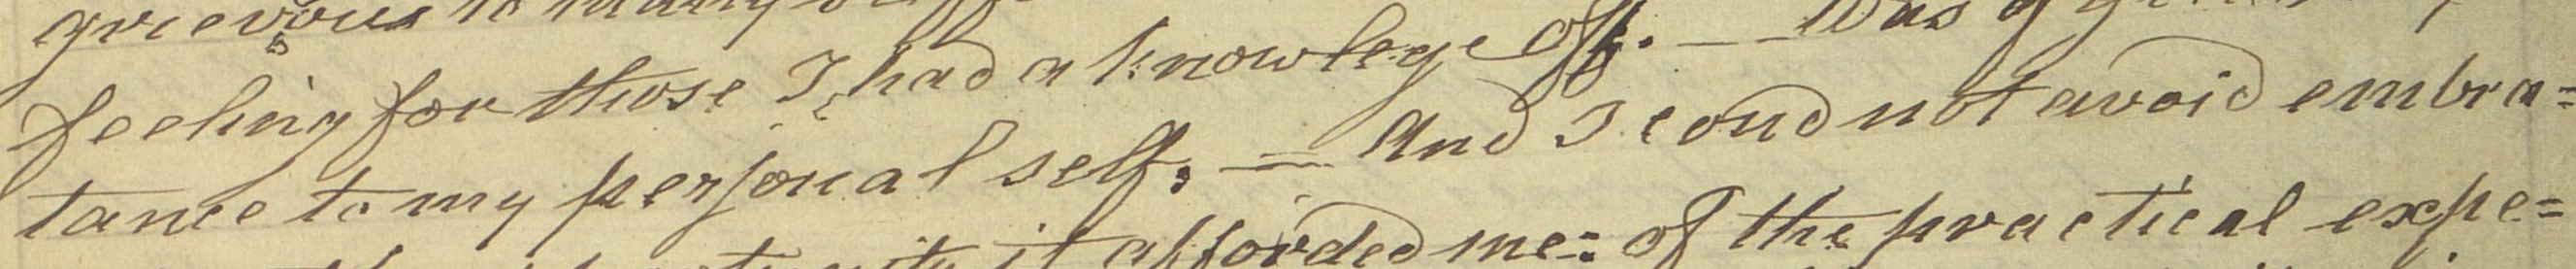-tance to my personal self, And I coud not avoid embra-
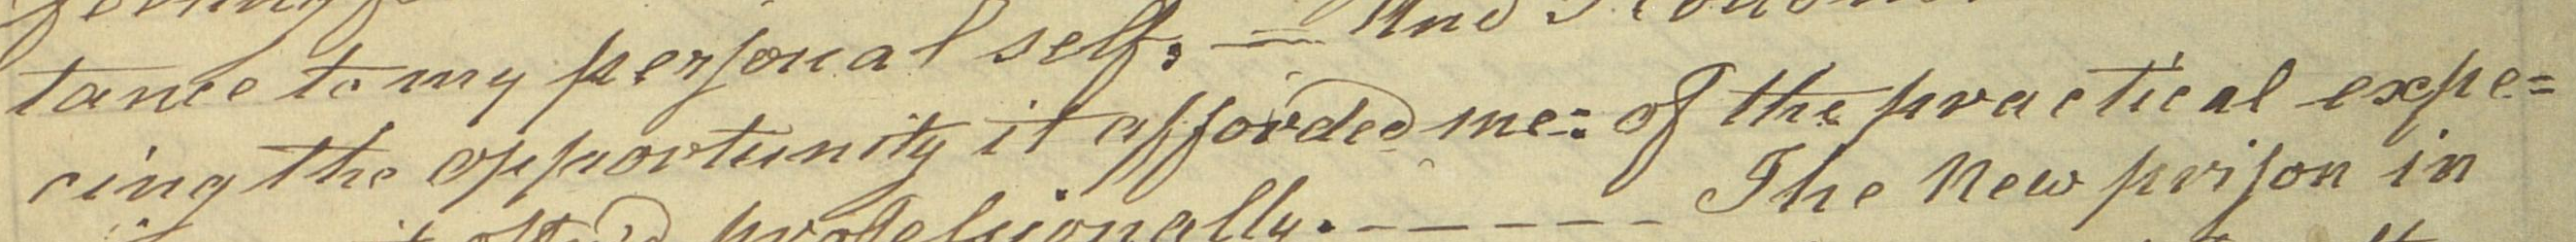-cing the opportunity it afforded me: of the practical expe-
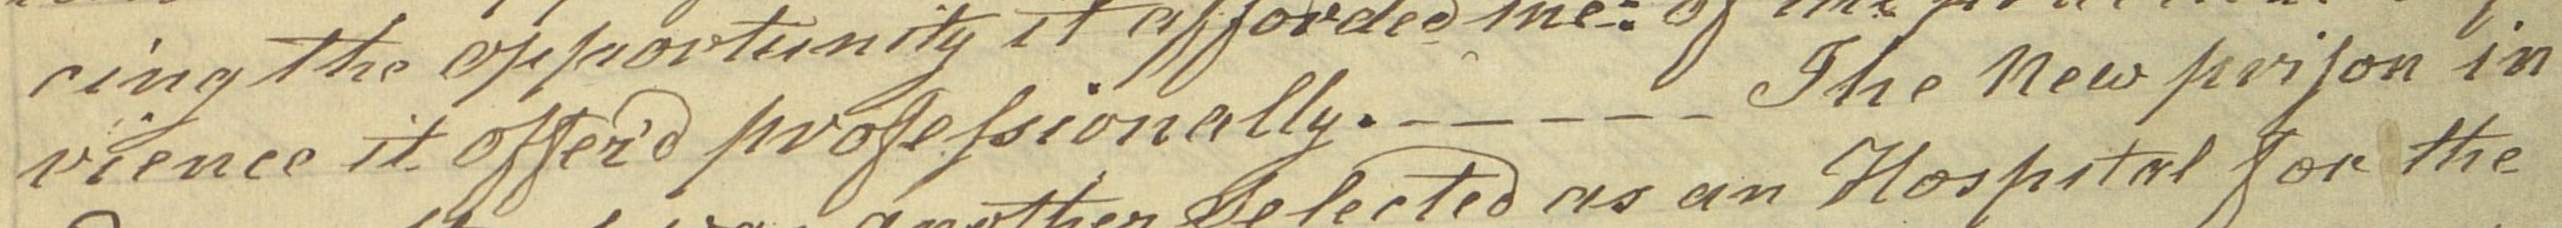-rience it offer'd professionally. The new person in
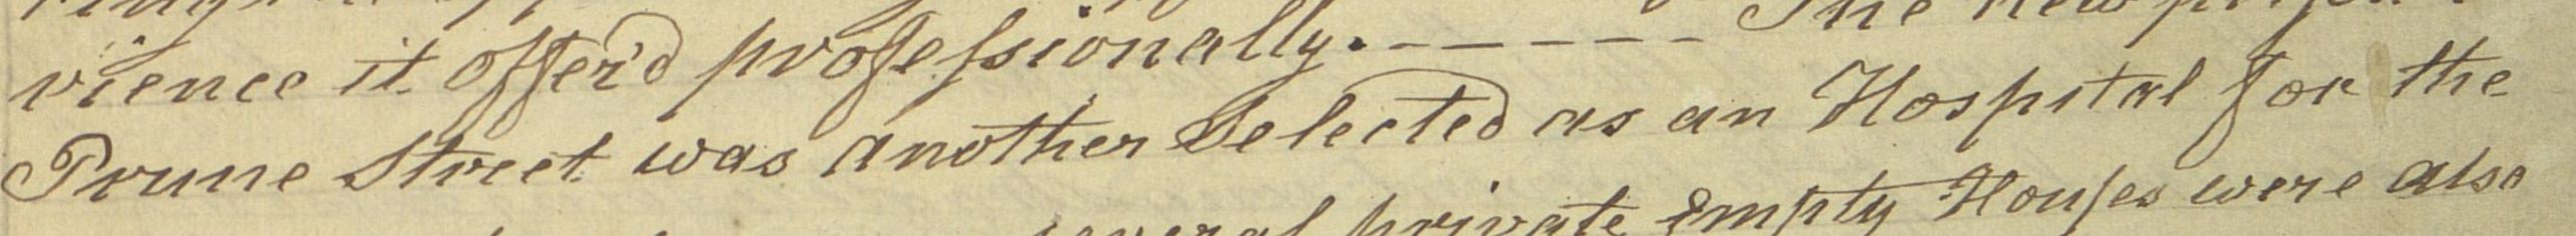Prune street was another Selected as an Hospital for the
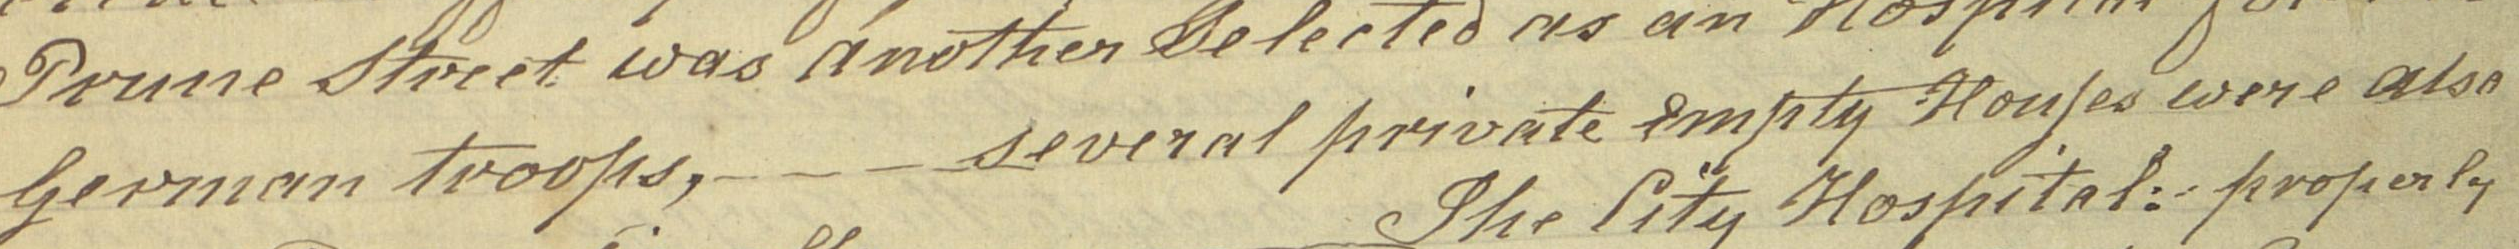German troops, several private empty Houses were also
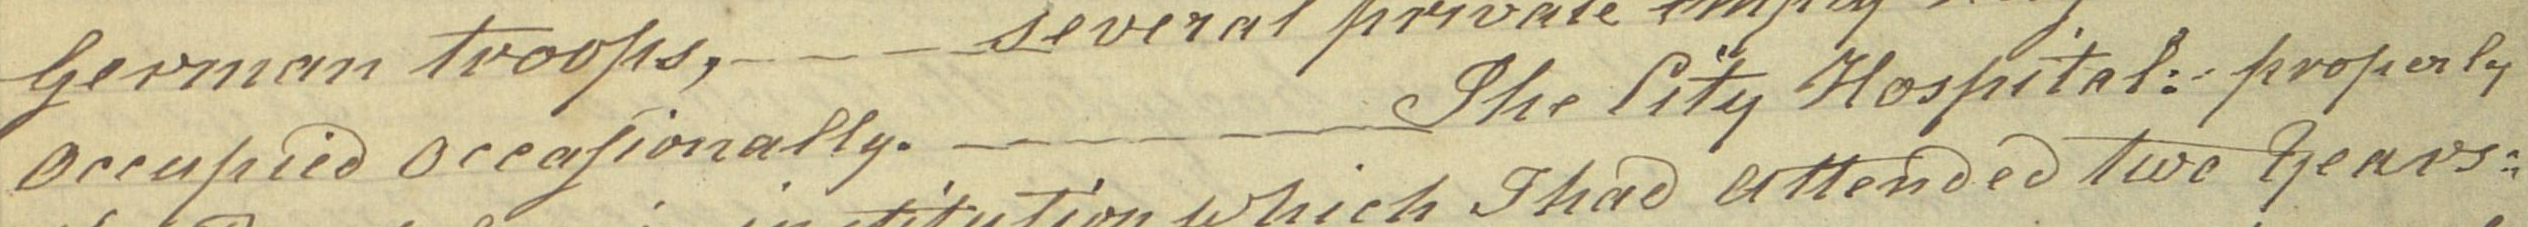occupied occasionally. The City Hospital: properly
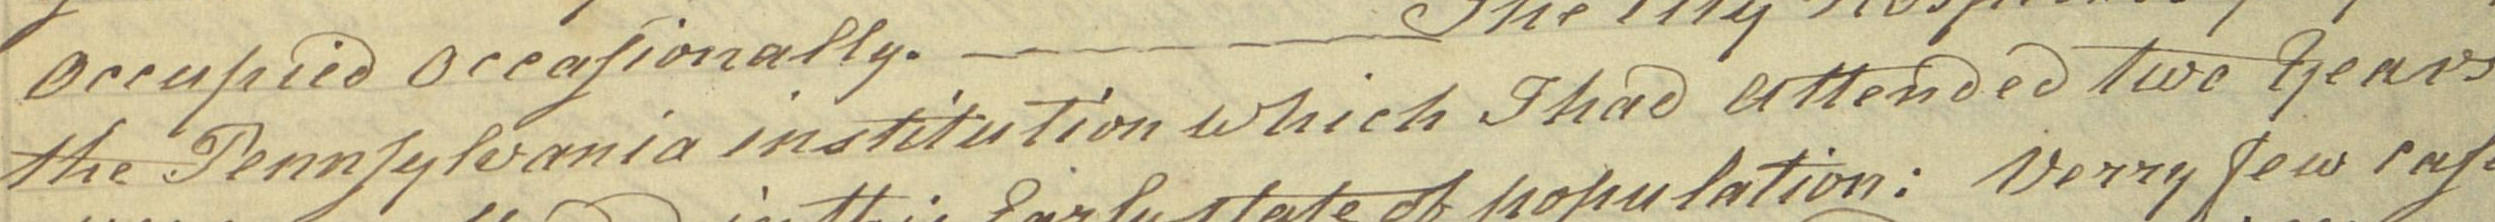the Pennsylvania institution which I had Attended two Years:
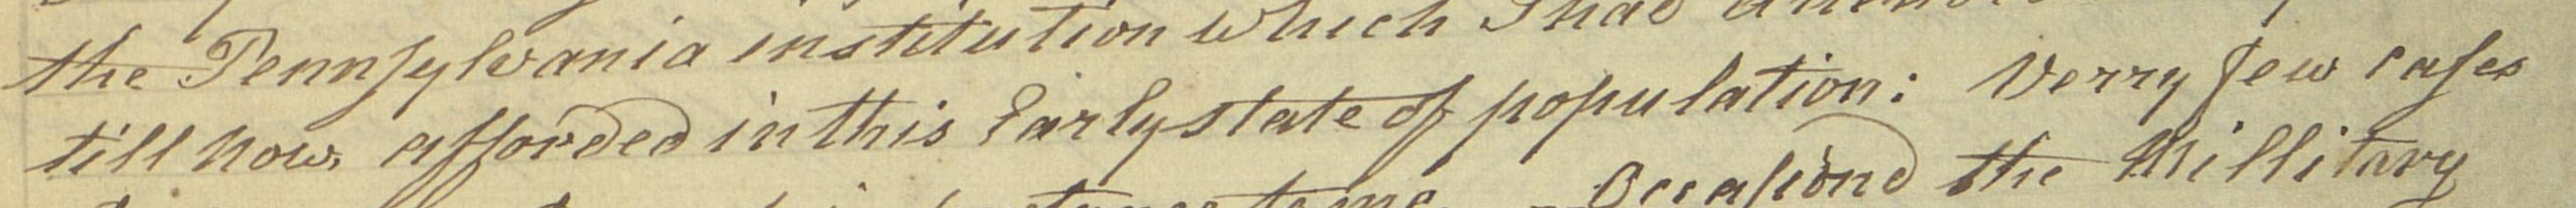till Now, afforded in this Early state of population: Verry few cases
